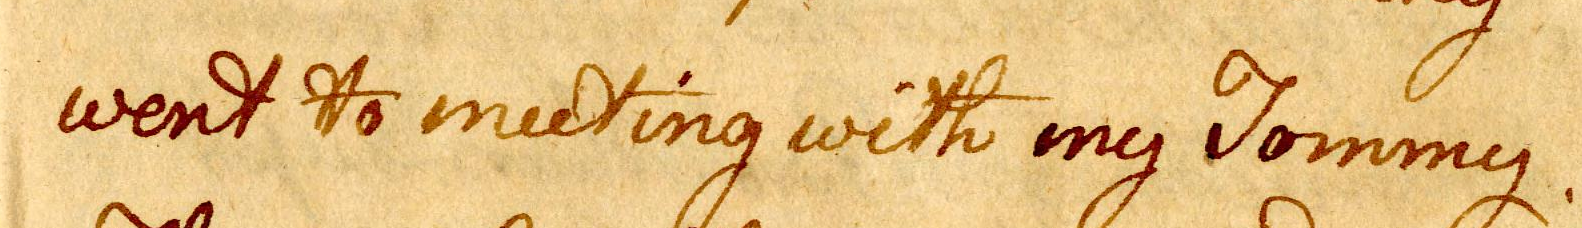went to meeting with my Tommy,
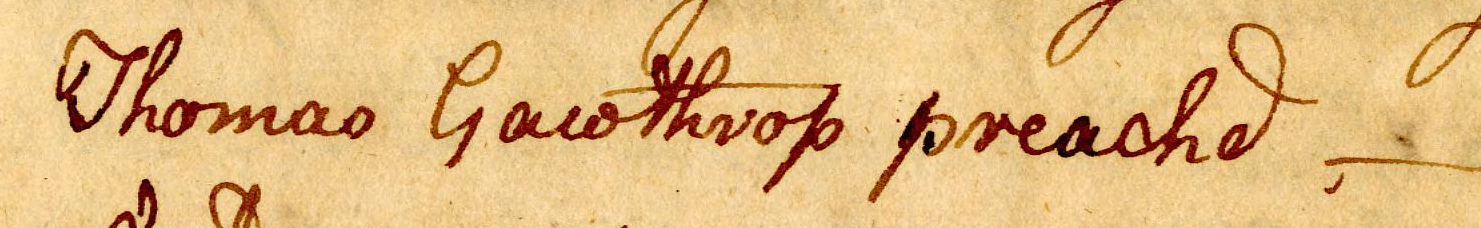Thomas Gawthrop preachd-
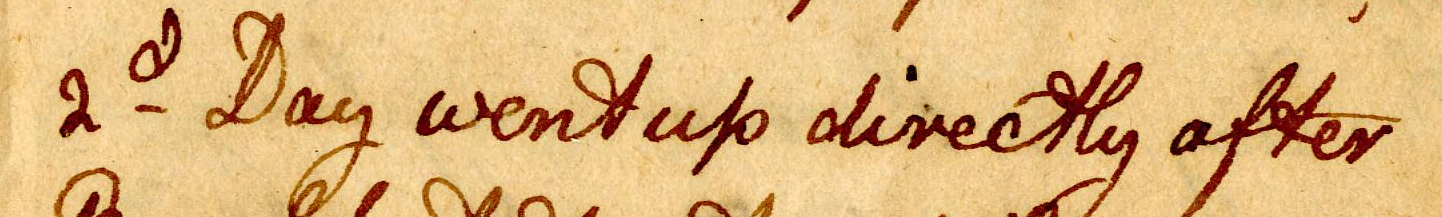2^d Day went up directly after
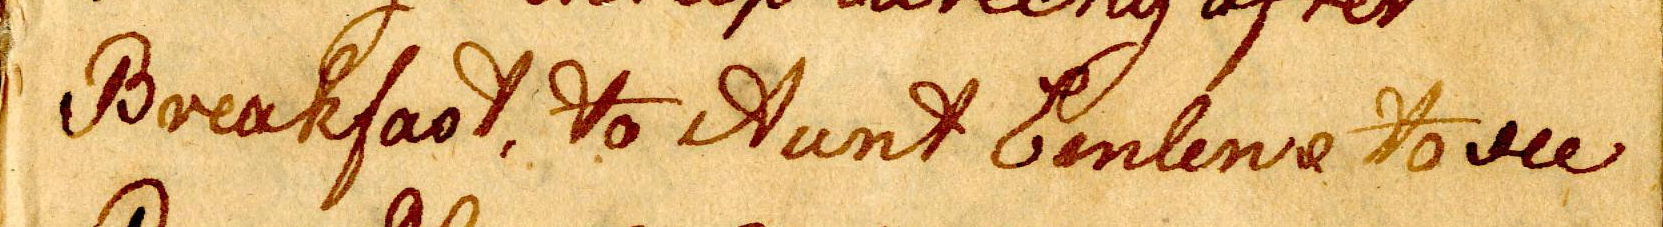Breakfast, to Aunt Emlens to see
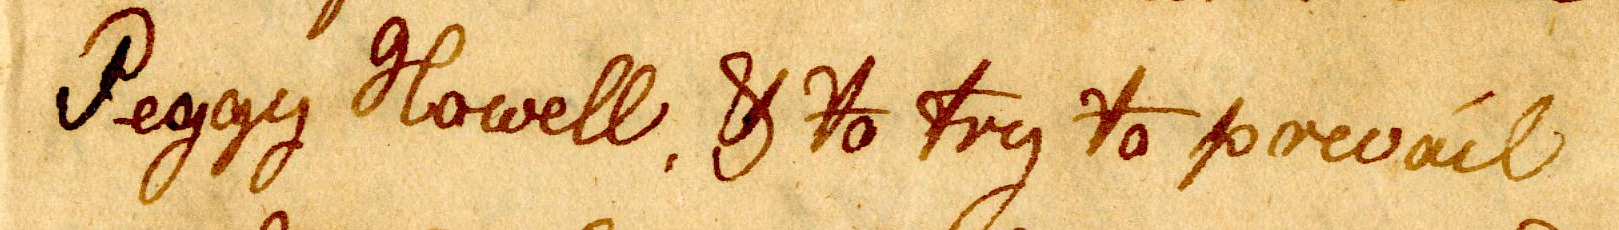Peggy Howell, & to try to prevail
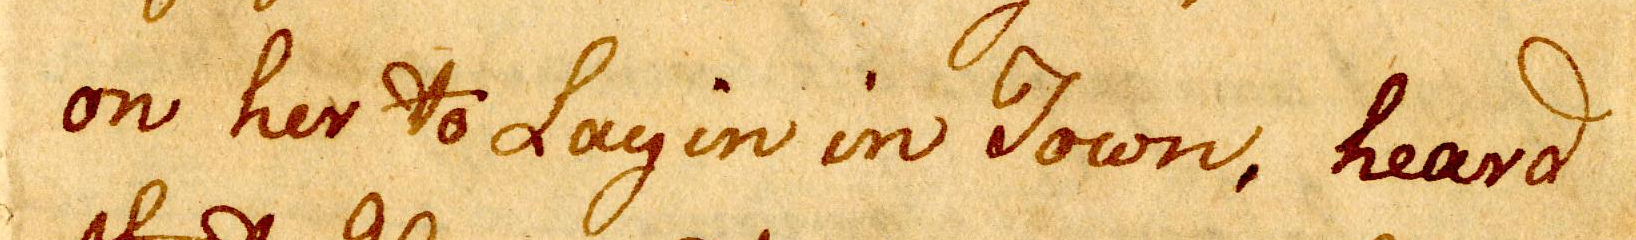on her to Lay in in Town, heard
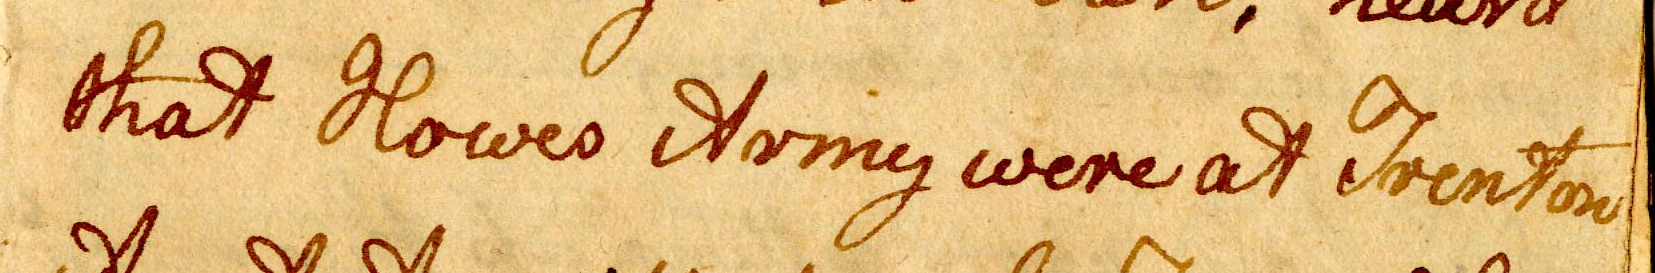that Howes Army were at Trenton
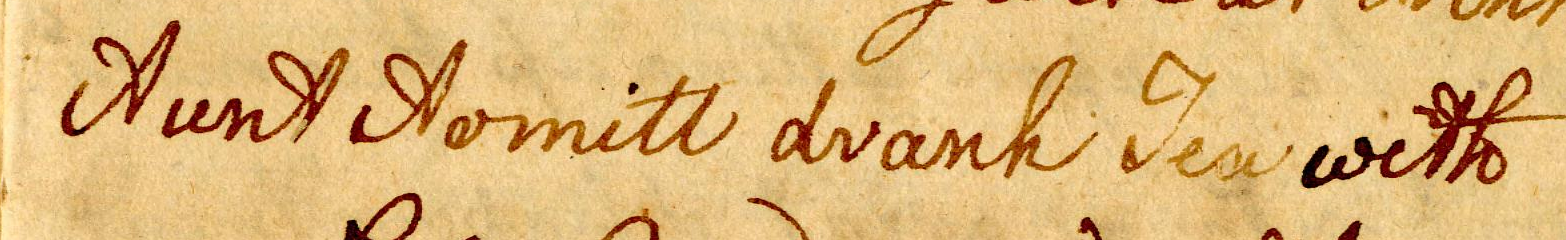Aunt Armitt drank Tea with
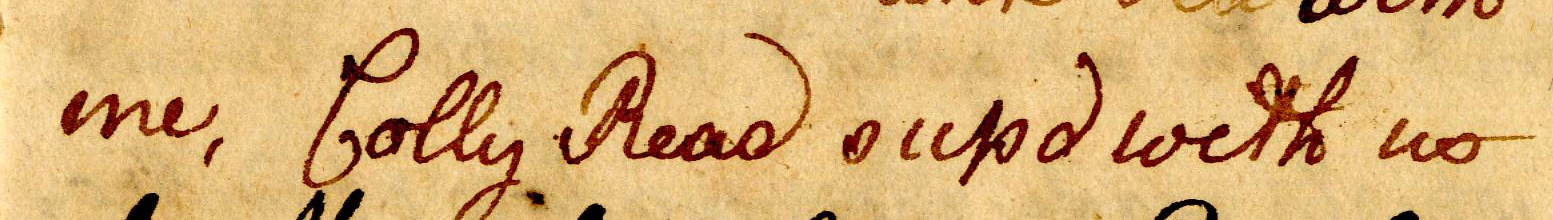me, Colly Read supd with us
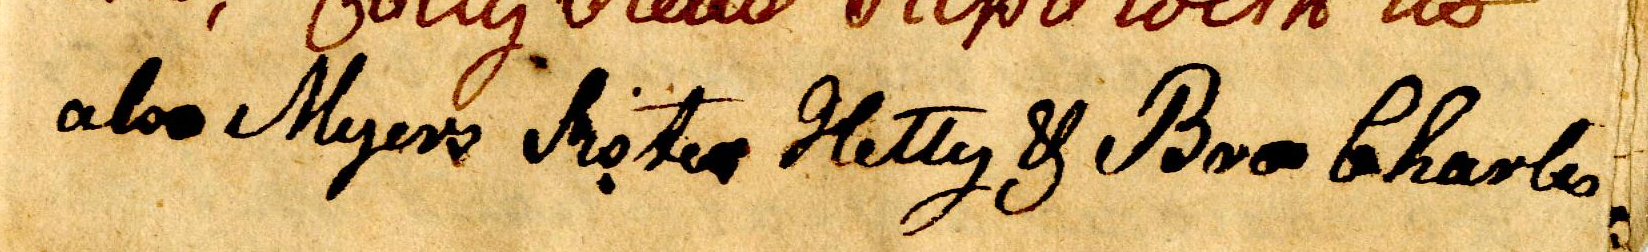also Myers Hetty & Bro Charles
